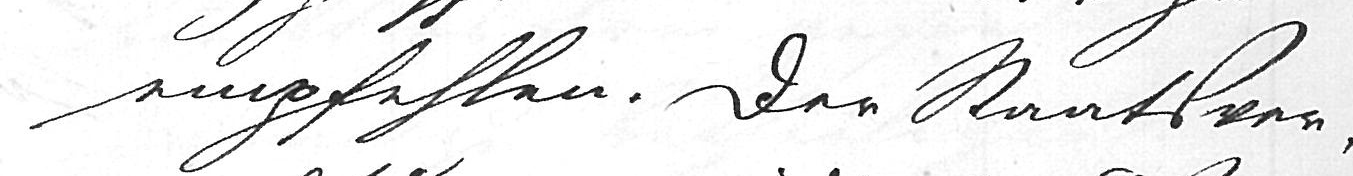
empfehlen. Der Staatsver-
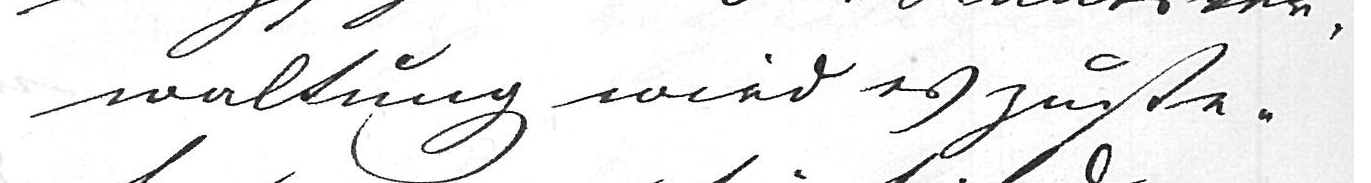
waltung wird es zuste-
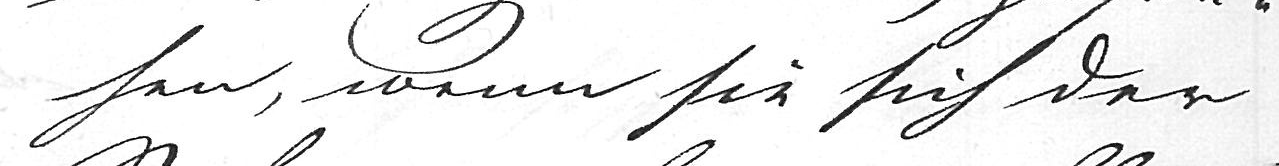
hen, wenn sie sich der
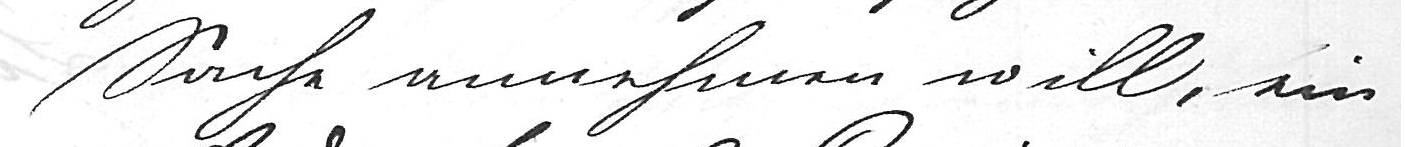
Sache annehmen will, ein
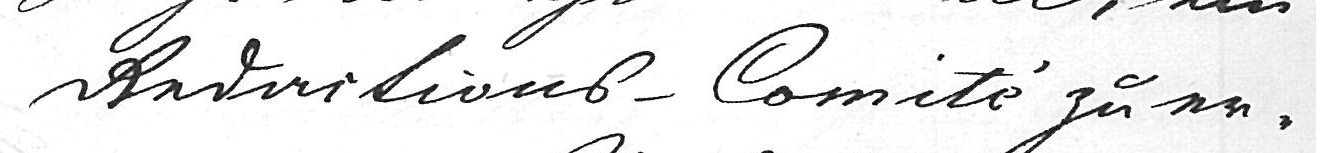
Redaction-Comité zu er-
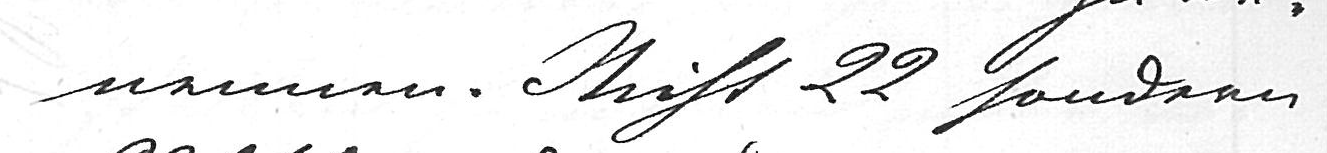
nennen. Nicht 22 sondern
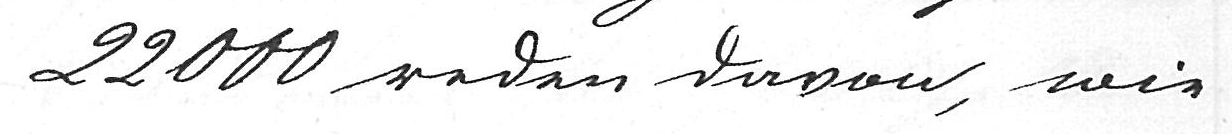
22000 reden davon, wie
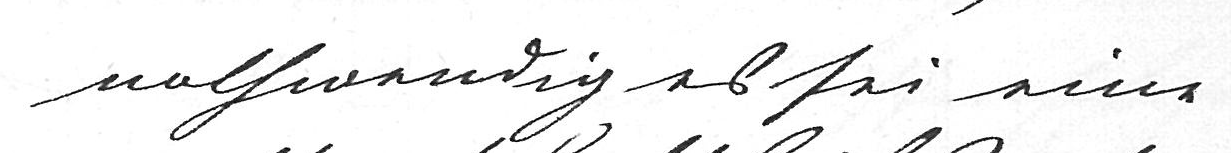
nothwendig es sei eine
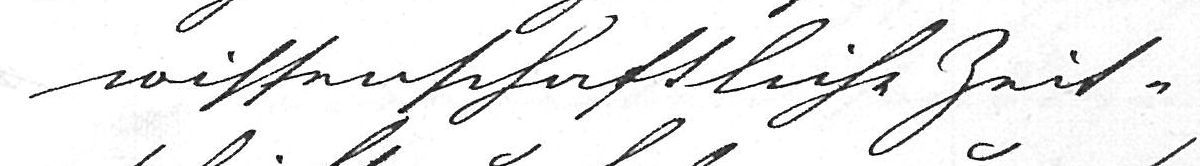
wissenschaftliche Zeit-
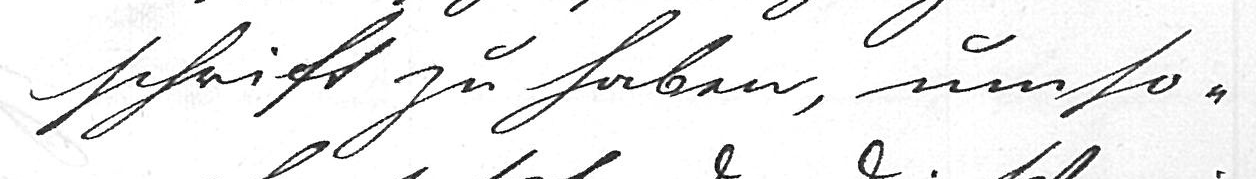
schrift zu haben, umso-
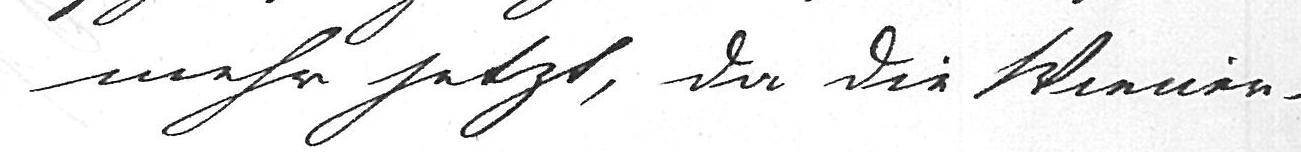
mehr jetzt, da die Wiener
